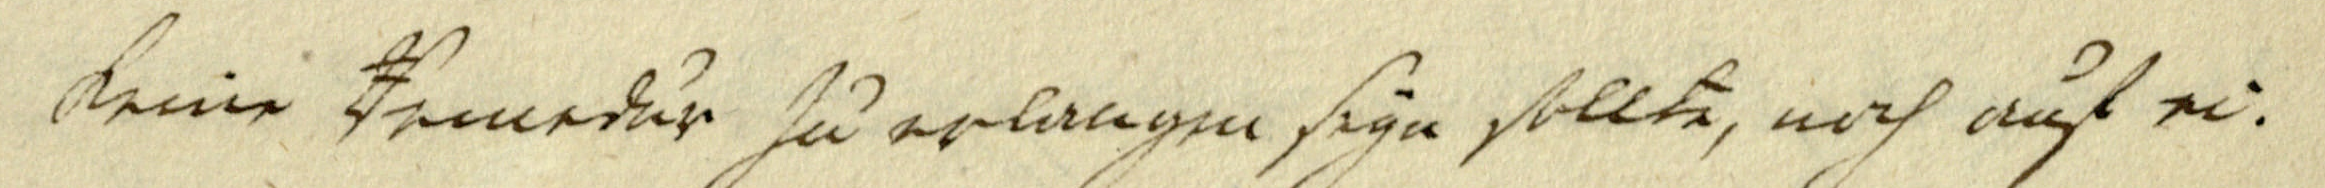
keine Remedur zu erlangen seÿn sollte, noch auf ei¬
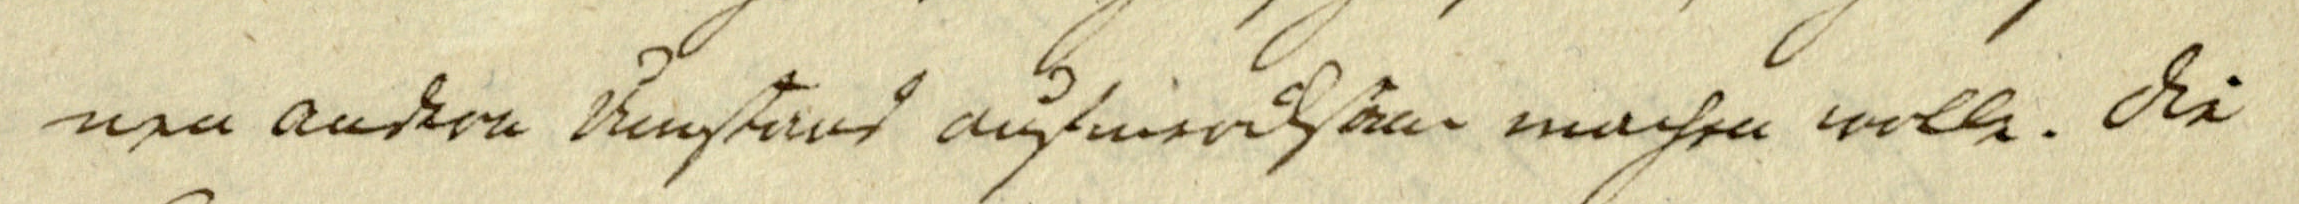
nen andern Umstand aufmercksam machen wolle. Die
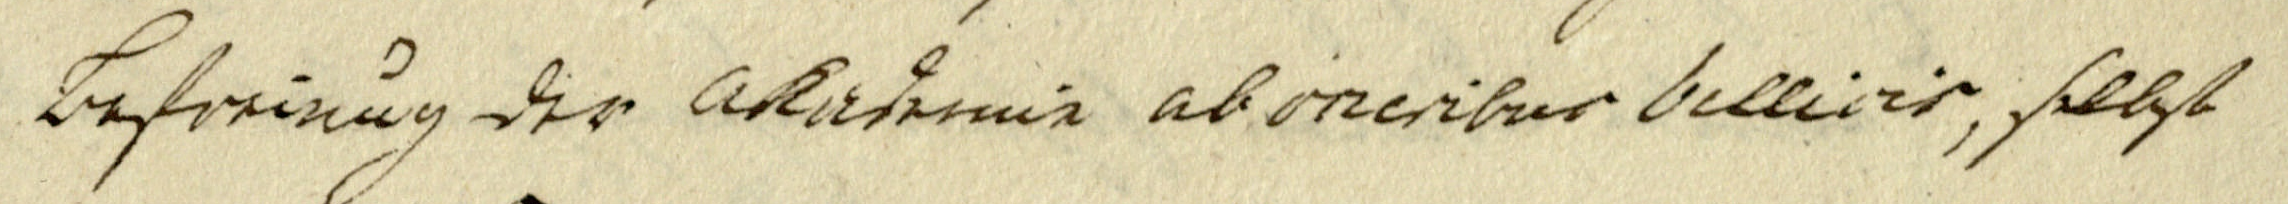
Befreiung der Akademie ab oneribus bellicis, selbst
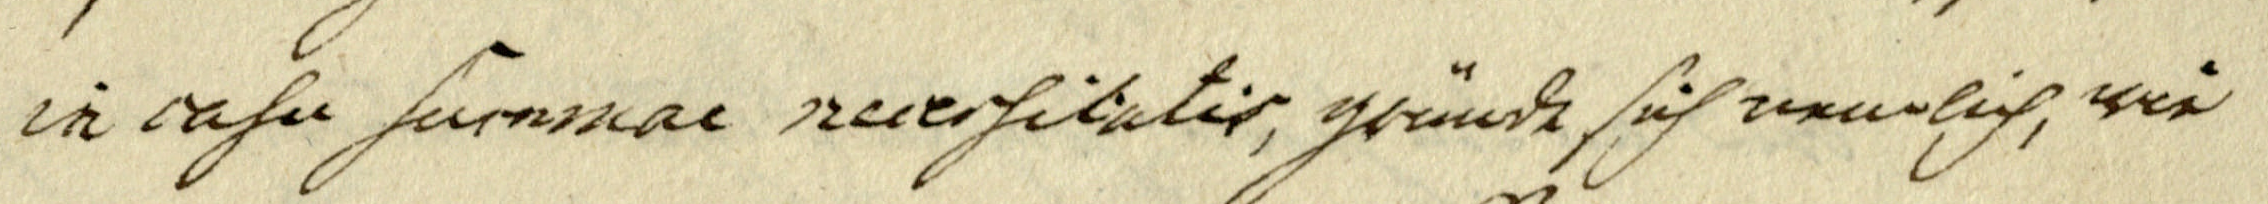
in casu summae necessitatis, gründe sich nemlich, wie
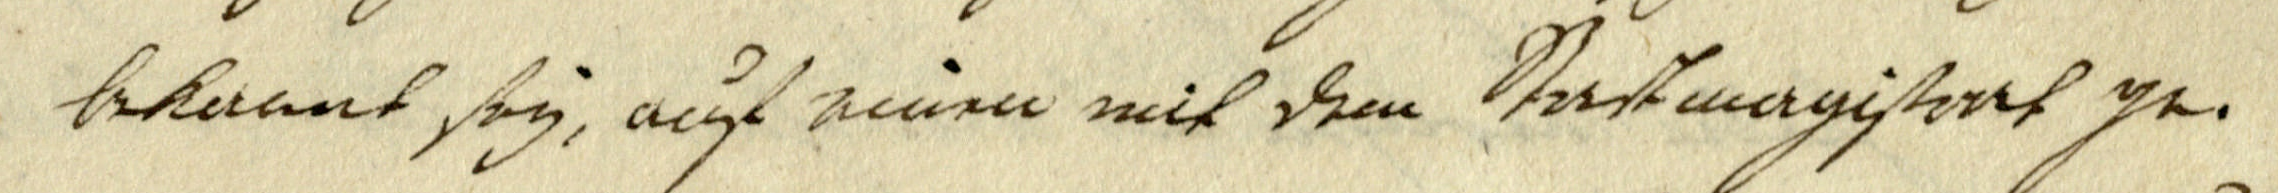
bekannt seÿ, auf einem mit dem Stadtmagistrat ge¬
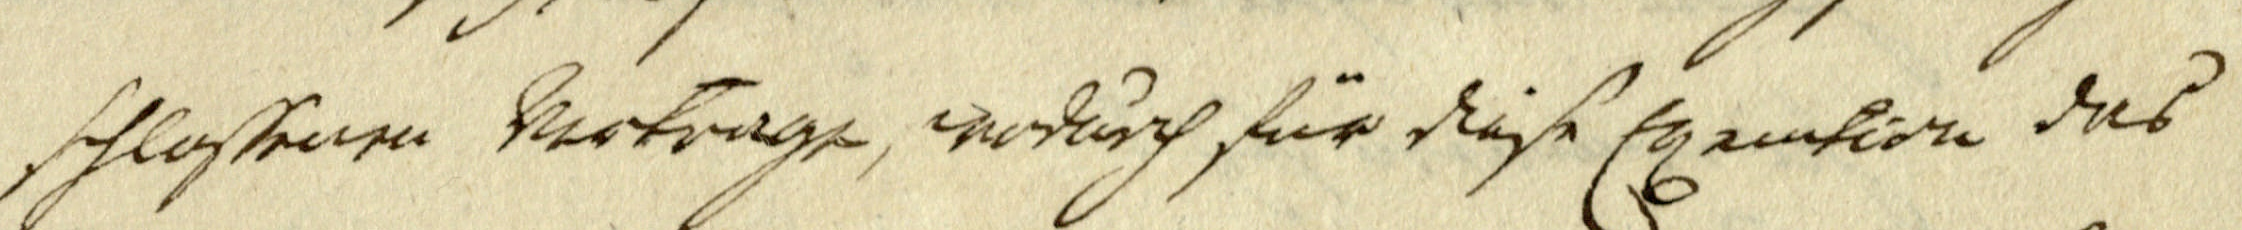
schlossenen Vertrage, wodurch für diese Exemtion das
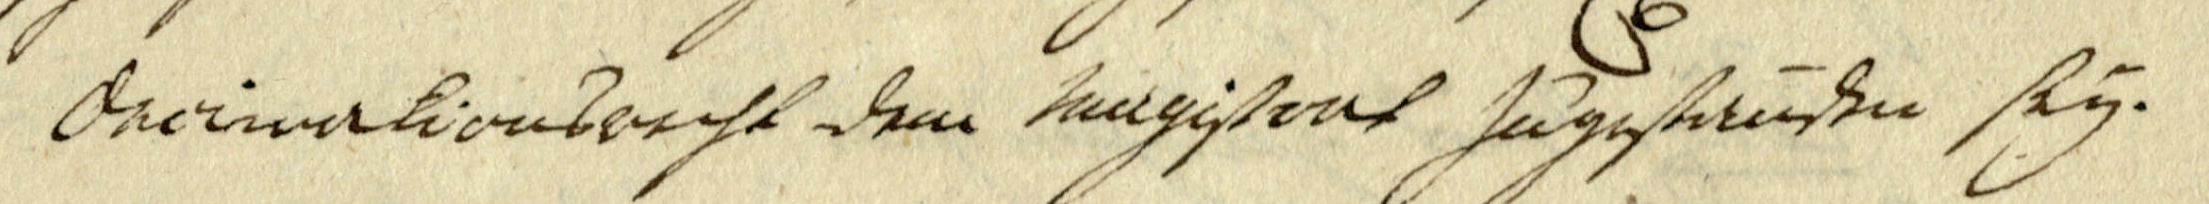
Decimationsrecht dem Magistrat zugestanden seÿ.
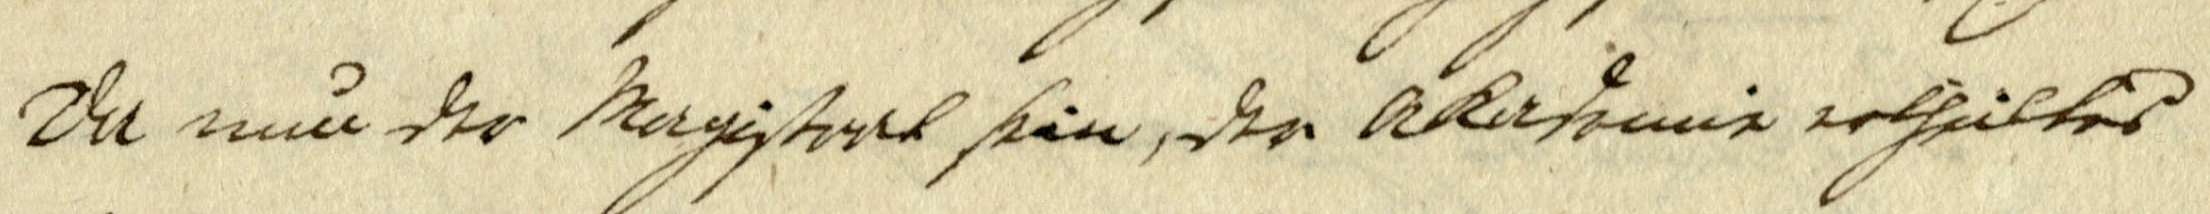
Da nun der Magistrat sein, der Akademie ertheiltes
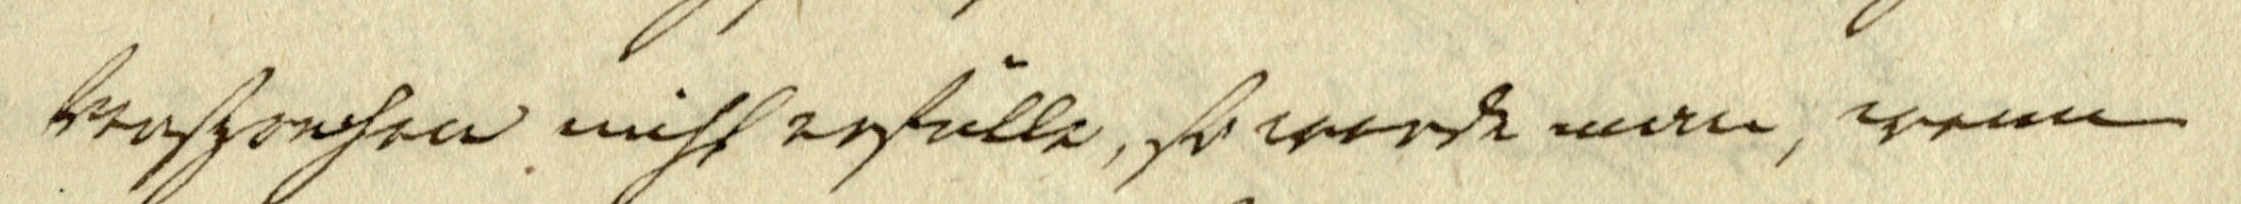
Versprechen nicht erfülle, so werde man, wenn
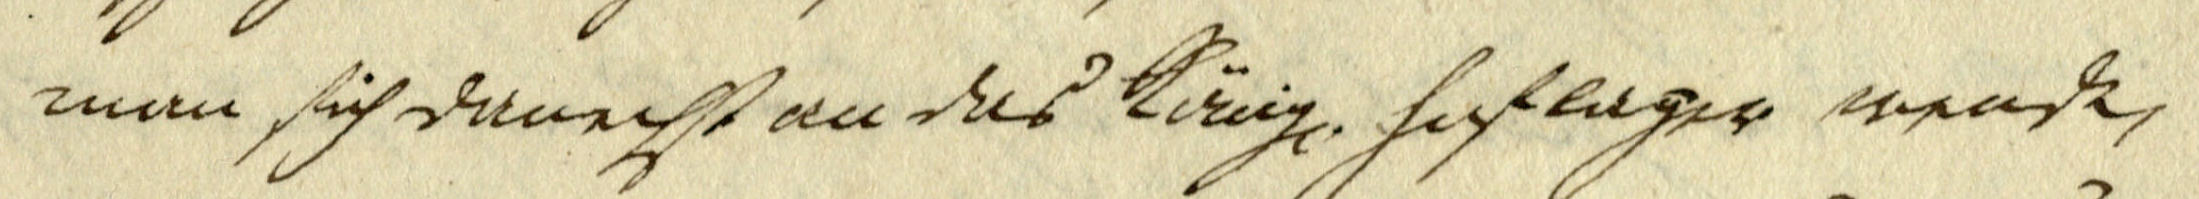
man sich danechst an das Königl. hoflager wende,
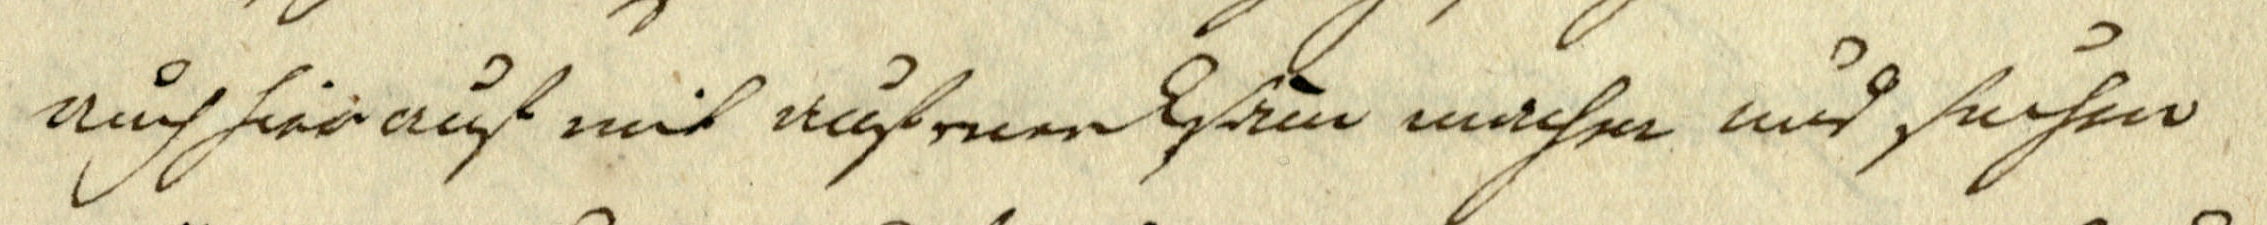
auch hierauf mit aufmercksam machen und suchen
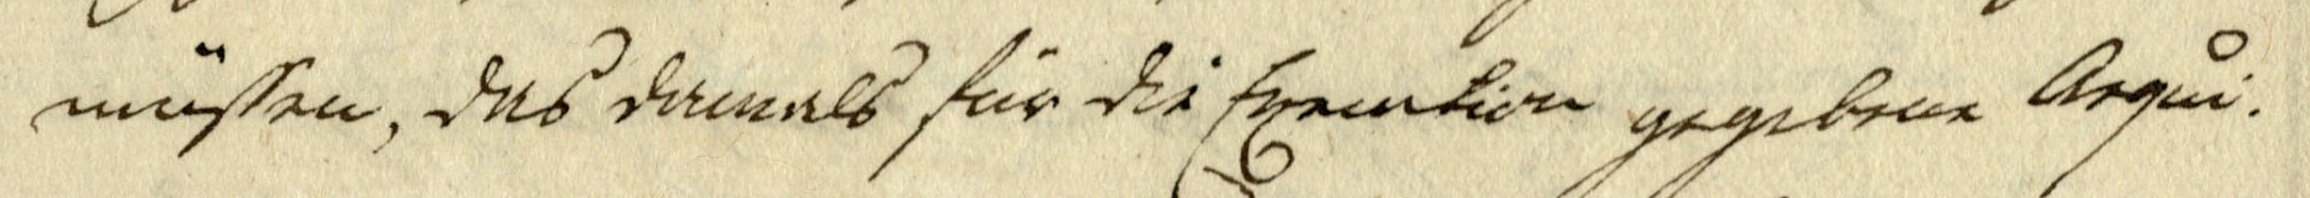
müssen, das damals für die Exemtion gegebene Aequi¬
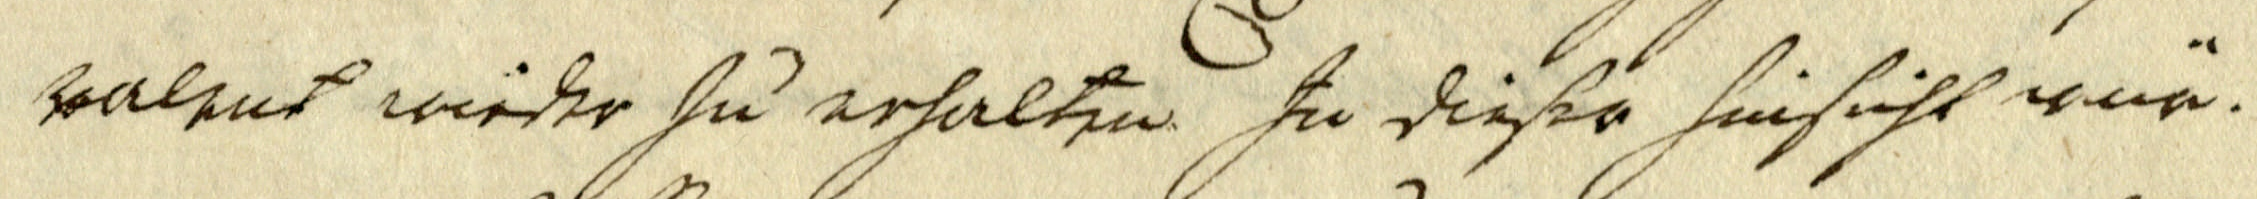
valent wieder zu erhalten. In dieser hinsicht wür¬
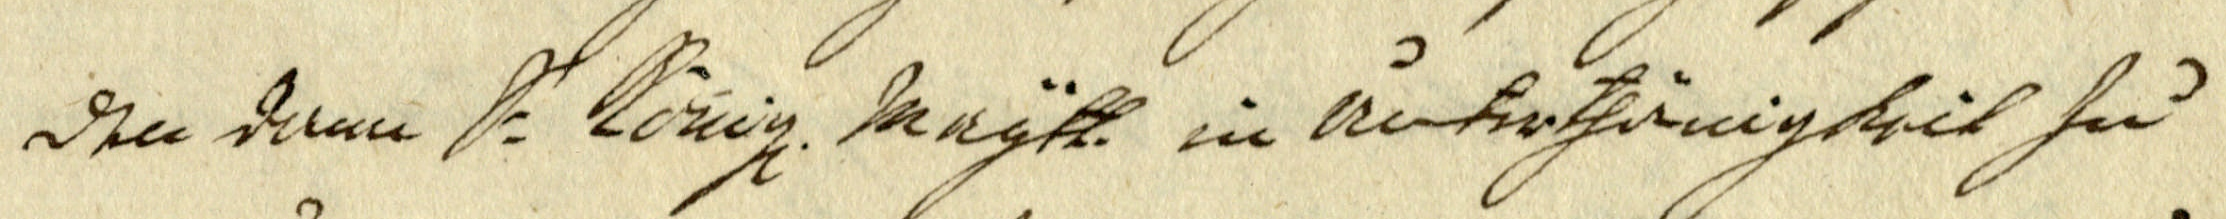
den dann Sr. Königl. Maÿtt. in Unterthänigkeit zu
